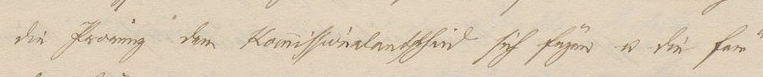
die Provinz dem Kommissionalentscheid sich fügen & die für
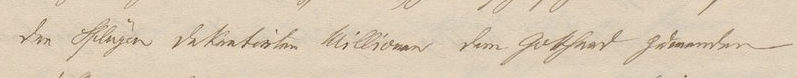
den Splügen dekretirten Millionen dem Gotthard zuwenden
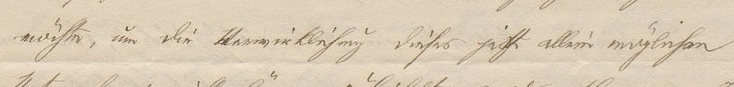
möchte, um die Verwirklichung dieses jetzt allein möglichen
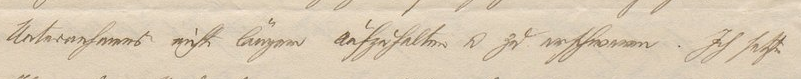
Unternehmens nicht länger aufzuhalten & zu erschweren. Ich setzte
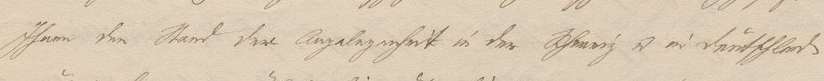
Ihnen den Stand der Angelegenheit in der Schweiz & in Deutschland
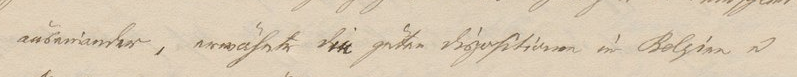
auseinander, erwähnte die guten Dispositionen in Belgien &
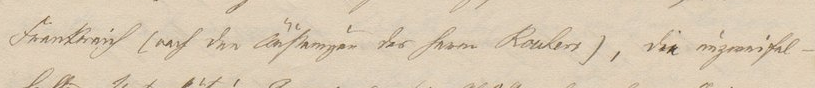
Frankreich (nach den Äusserungen des Herrn Rouhers ), die unzweifel-
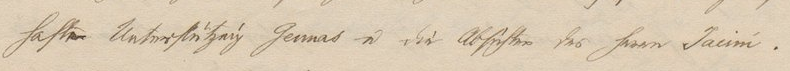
hafte Unterstützung Genuas & die Absichten des Herrn Jacini.
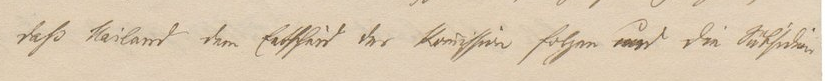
daß Mailand dem Entscheid der Kommission folgen und die Subsidien
